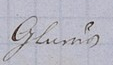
Glarus
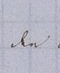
den
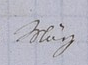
8. März
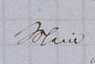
Mein
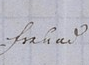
theurer
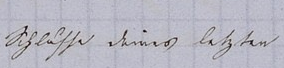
Schlusse Deines letzten
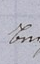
den
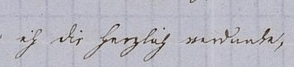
ich Dir herzlich verdanke,
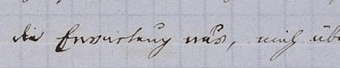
die Erwartung aus, mich über-
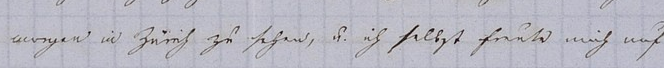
morgen in Zürich zu sehen, u. ich selbst freute mich auf
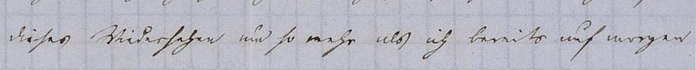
dieses Wiedersehen um so mehr als ich bereits auf morgen
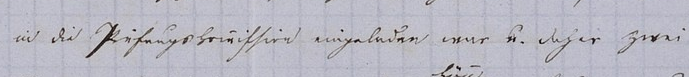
in die Prüfungskommission eingeladen war u. daher zwei
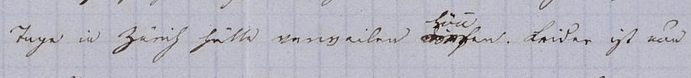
Tage in Zürich hätte verweilen dürfenkönnen. Leider ist nun
